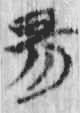昜（陽）
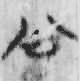公
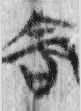命
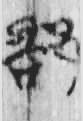○（敢）
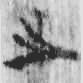之
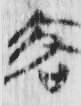客
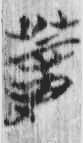蔁
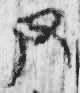尹
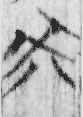癸
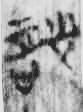○（察）
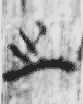之
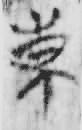東
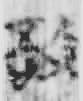敔
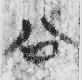公
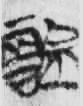○（舒）
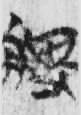痹
